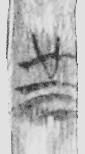{廿三}
